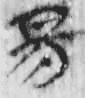昜（陽）
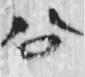公
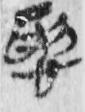惃
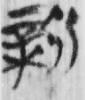新
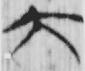大
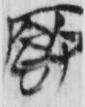○（厩）
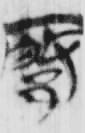○（殷）
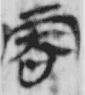丙
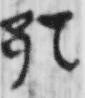○（鄖）
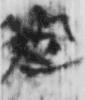○（卜）
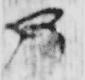尹
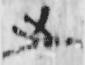之
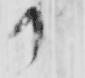人
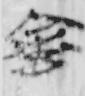舒
